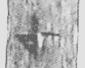七十
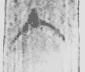六
